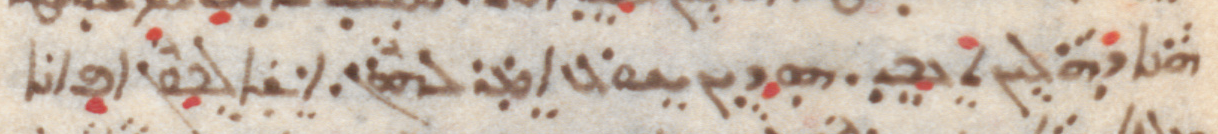ܗܢܐ ܕܗܠܝܢ ܬܥܒܕ. ܗ̣ܘ ܕܝܢ ܝܫܘܥ ܐܡܪ ܠܗܘܢ. ܐܫܐܠܟܘܢ ܐܦ ܐܢܐ
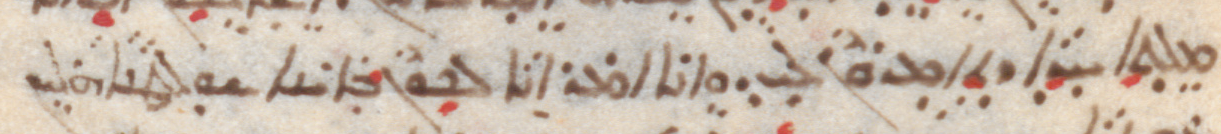ܡܠܬܐ ܚܕܐ ܕܬܐܡܪܘܢ ܠܝ܆ ܘܐܢܐ ܐܡܪ ܐܢܐ ܠܟܘܢ ܒܐܝܢܐ ܫܘܠܛܢܐ ܗܠܝܢ
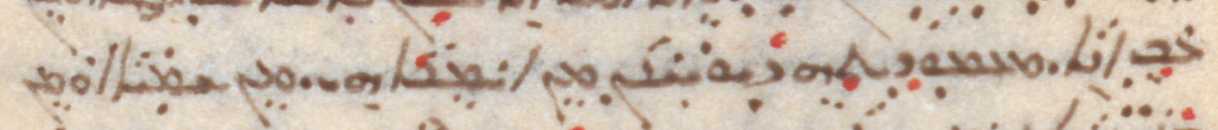ܥ̇ܒܕ ܐܢܐ. ܡܥܡܘܕܝܬܗ ܕܝܘܚܢܢ ܡܢ ܐܡܟܐ ܗܝ. ܡܢ ܫܡܝܐ ܐܘ ܡܢ
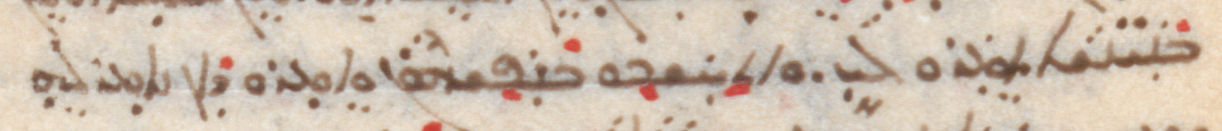ܒܢܝ̈ܢܫܐ ܐܡܪܘ ܠܝ. ܘܐܬܚܫܒܘ ܒܢܦܫܗܘܢ ܘܐܡ̣ܪܘ ܕܐܢ ܢܐܡܪ ܠܗ
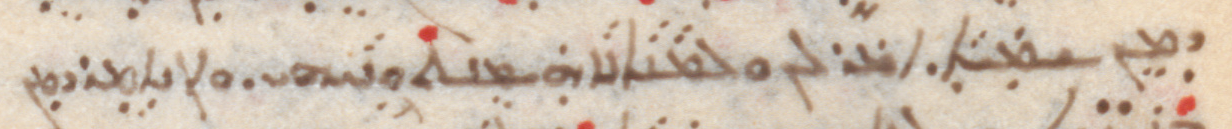ܕܡܢ ܫܡܝܐ܆ ܐܡ̇ܪ ܠܢ ܘܠܡܢܐ ܠܐ ܗܡܢܬܘܢܝܗܝ. ܘܐܢܐܡܪ ܕܡܢ
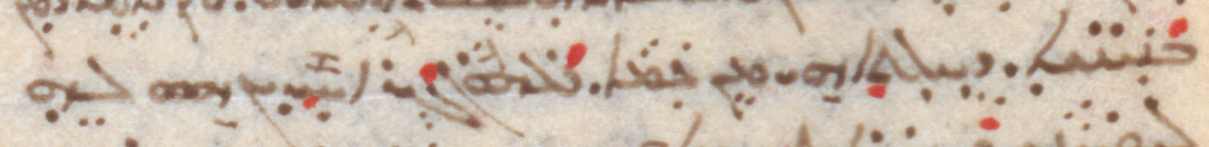ܒܢܝܢ̈ܫܐ܆ ܕܚܠܬܐ ܗܝ ܡܢ ܥܡܐ. ܟܠܗܘܢ ܓܝܪ ܐܚܝܕܝܢ ܗܘܘ ܠܗ
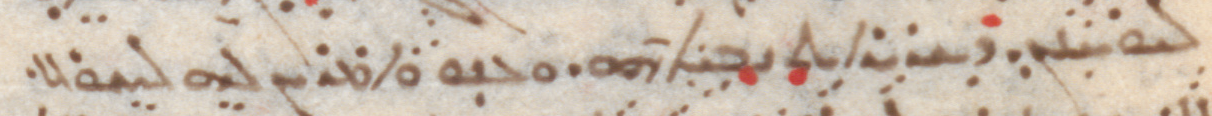ܠܝܘܚܢܢ܆ ܕܫܪܝܪܐܝܬ ܢܒܝܐ ܗܘ. ܘܥܢ̣ܘ ܘܐܡ̇ܪܢ ܠܗ ܠܝܫܘܥ.
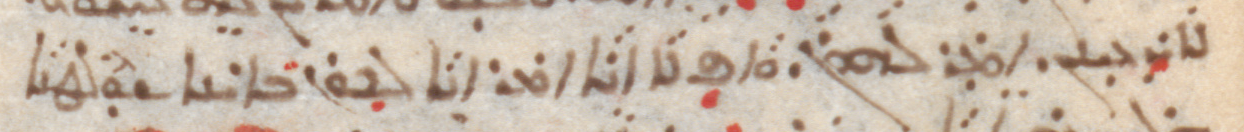ܠܐ ܝ̇ܕܥܝܢܢ. ܐܡܪ ܠܗܘܢ܇ ܘܐܦ ܠܐ ܐܢܐ ܐܡ̇ܪ ܐܢܐ ܠܟܘܢ ܒܐܝܢܐ ܫܘܠܛܢܐ
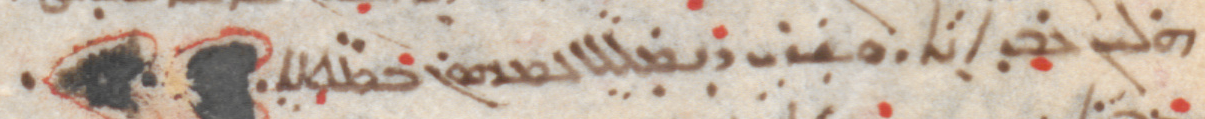ܗܠܝܢ ܥ̇ܒܕ ܐܢܐ. ܘܫܪܝ ܕܢܡܠܠ ܥܡܗܘܢ ܒܡ̈ܬܠܐ. ܀ ܀ .
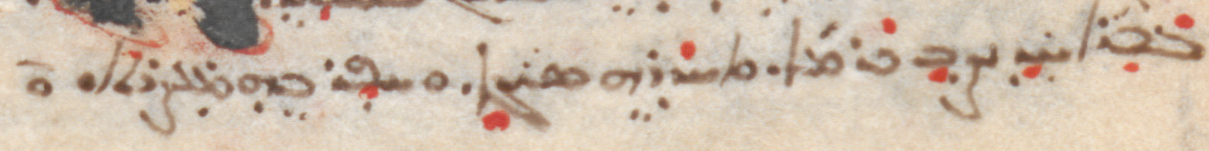ܓܒܪܐ ܚܕ ܢܨ̣ܒ ܟܪܡܐ. ܘܐܚܕܪܗ ܣܝܓܐ. ܘܚܦ̣ܪ ܒܗ ܡܥܨܪܬܐ. ܏ܘ
